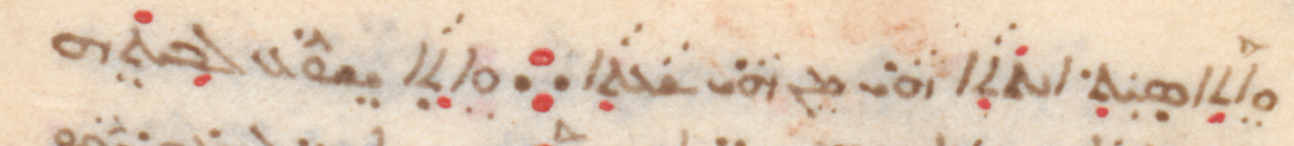ܘܐܬܐܣܝܬ݀ ܐܢܬܬܐ ܗ̇ܝ ܡ̣ܢ ܗ̇ܝ ܫܥܬܐ܀ ܘܐܬ̣ܐ ܝܫܘܥ ܠܒܝܬܗ
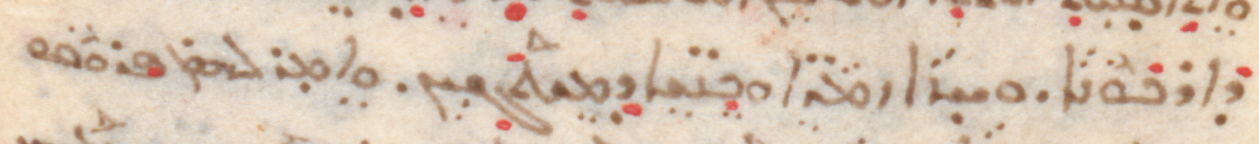ܕܐܪܟܘܢܐ. ܘܚ̣ܙܐ ܙܡܪ̈ܐ ܘܟܢ̈ܫܐ ܕܡܫܬܓܫܝܢ. ܘܐܡ̣ܪ ܠܗܘ̇ܢ ܦܪܘܩܘ
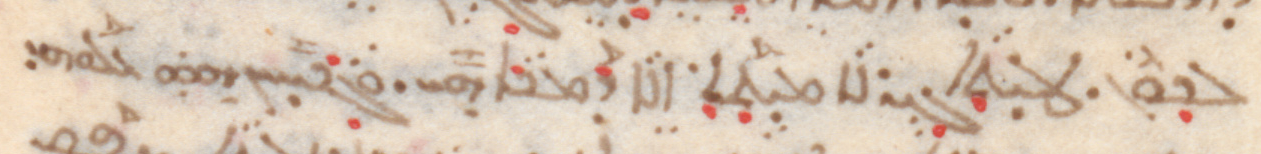ܠܟܘ̇ܢ . ܛܠܝܬܐ ܓܝܪ ܠܐ ܡܝܬܬ݀ ܐܠܐ ܕܡܟܐ ܗ̣ܝ. ܘܓܒܚ̣ܝܢ ܗܘܘ ܥܠܘܗܝ
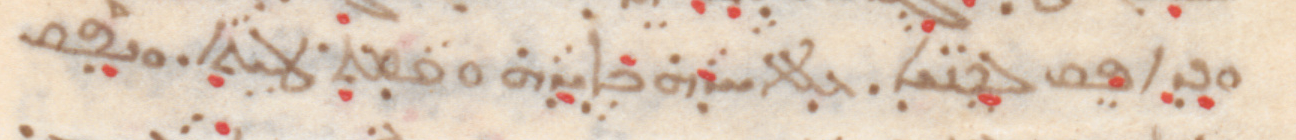ܘܟܕ ܐܦܩ ܠܟܢ̈ܫܐ܆ ܥ̣ܠ ܐܚܕܗ̇ ܒܐܝܕܗ̇ ܘܩܡ̣ܬ ܛܠܝܬܐ. ܘܢܦ̣ܩ
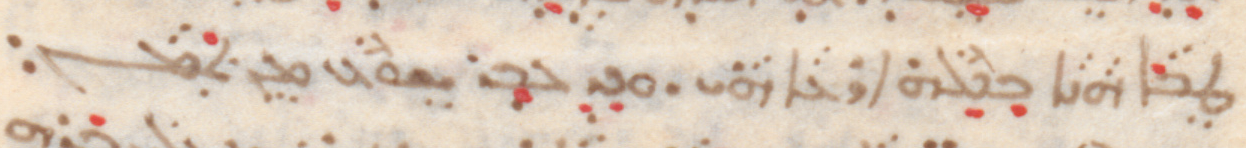ܛܒܐ ܗܢܐ ܒܟܠܗ̇ ܐܪܥܐ ܗ̇ܝ. ܘܟܕ ܥܒܪ ܝܫܘܥ ܡ̣ܢ ܬܡܢ܆
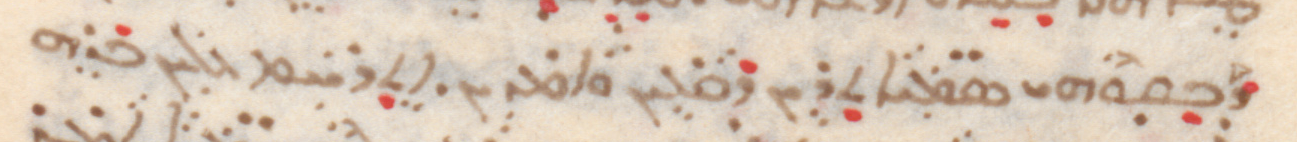ܕܒܩܘܗܝ ܣ̈ܡܝܐ ܬܪܝܢ ܕܩ̇ܥܝܢ ܘܐܡ̇ܪܝܢ. ܐܬܪܚܡ ܥܠܝܢ ܒܪܗ
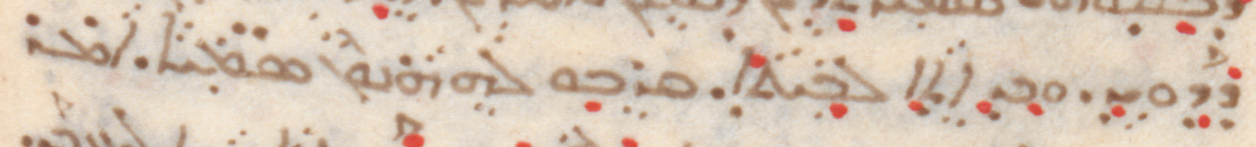ܕܕܘܝܕ. ܘܟܕ ܐܬܐ ܠܒܝܬܐ. ܩܪܒܘ ܠܗ ܗ̇ܢܘܢ ܣܡ̈ܝܐ. ܐܡ̇ܪ
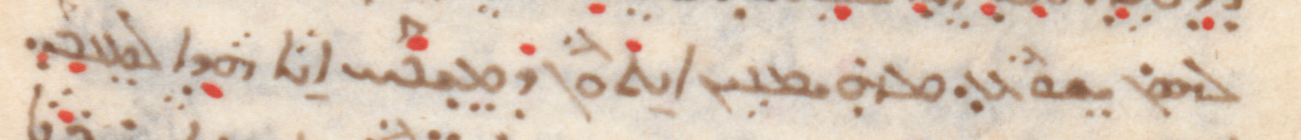ܠܗܘ̇ܢ ܝܫܘܥ܆ ܡܗ̇ܝܡܢܝܢ ܐܢܬܘܢ ܕܡܫܟܚ ܐܢܐ ܗܕܐ ܠܡܥܒܕ:
